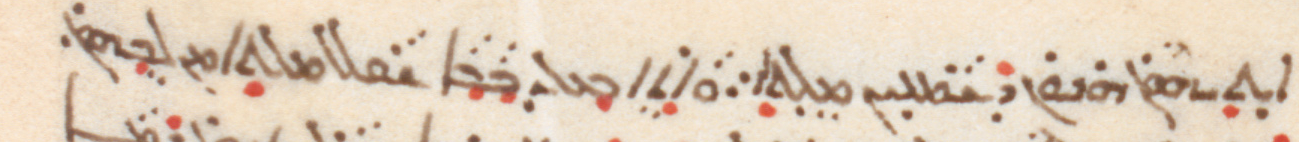ܐܝ̣ܬܝܗܘܢ ܗ̇ܢܘܢ ܕܫ̇ܡܥ̣ܝܢ ܡܠܬܐ܇ ܘܐܬ̇ܐ ܒܥܠܕܒܒܐ ܫ̇ܩܠ ܡܠܬܐ ܡ̣ܢ ܠܒܗܘܢ܇
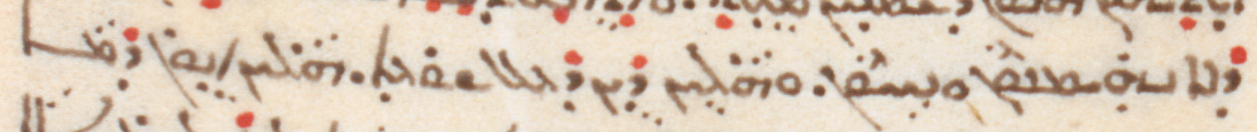ܕܠܐ ܢܗ̇ܝܡܢܘܢ ܘܢܚܘܢ. ܘܗ̇ܠܝܢ ܕܝܢ ܕܥܠ ܫܘܥܐ. ܗ̇ܠܝܢ ܐܢܘܢ ܕܡܐ
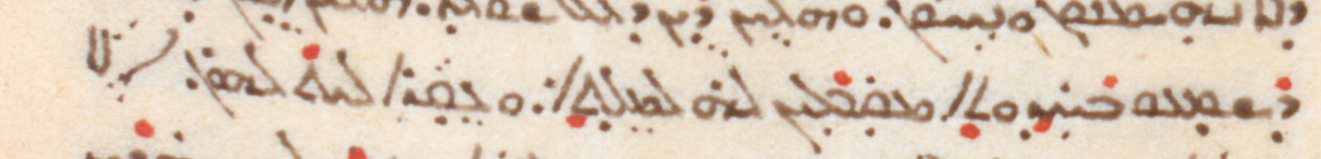ܕܫܡ̣ܥܘ ܒܚܕܘܬܐ ܡܩܒܠܝܢ ܠܗ̇ ܠܡܠܬ̣ܐ܇ ܘܥܩ̣ܪܐ ܠܝܬ ܠܗܘܢ. ܐܠܐ
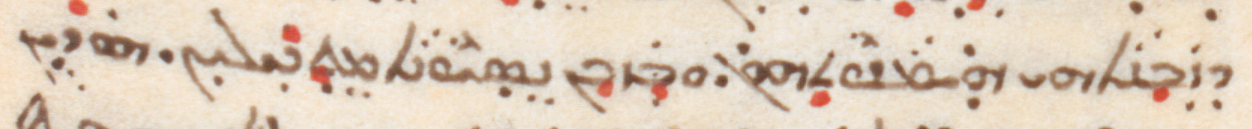ܕܙܒܢܐ ܗܝ ܗܝܡܢܘܬܗܘܢ. ܘܒܙܒܢ ܢܣ̣ܝܘܢܐ ܡܬ̣ܟܫܠܝܢ. ܗ̇ܘ ܕܝܢ
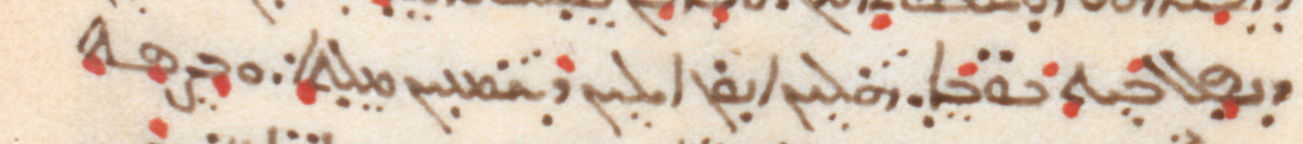ܕܢܦ̣ܠ ܒܝܬ ܟܘ̈ܒܐ܆ ܗ̇ܠܝܢ ܐܢܘܢ ܐܝܠܝܢ ܕܫ̇ܡܥ̣ܝܢ ܡܠ̣ܬܐ܇ ܘܒܨܦܬܐ
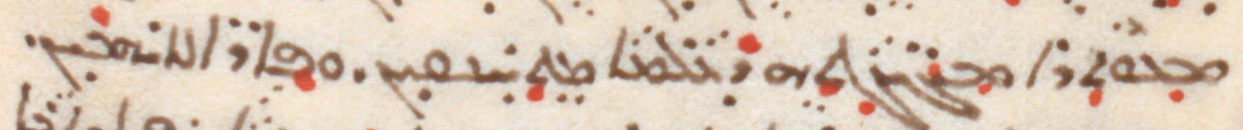ܘܒܥܘܬܪܐ ܘܒܪ̈ܓܝܓܬܗ ܕܥܠܡܐ ܡܬܚܢܩܝܢ. ܘܦܐܪ̈ܐ ܠܐ ܝ̇ܗܒ̣ܝܢ.
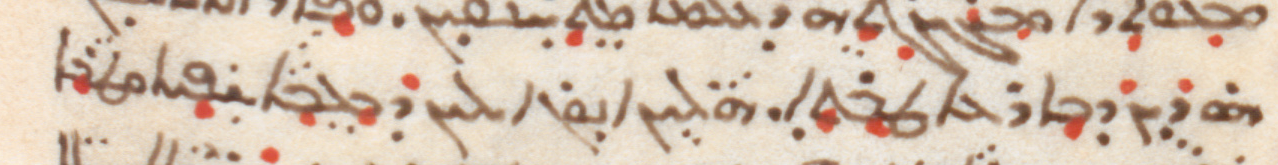ܗ̇ܘ ܕܝܢ ܕܒܐܪܥܐ ܛܒܬܐ܆ ܗ̇ܠܝܢ ܐܢܘܢ ܐܝܠܝܢ ܕܒܠܒܐ ܫܦܝܐ ܘܛܒܐ
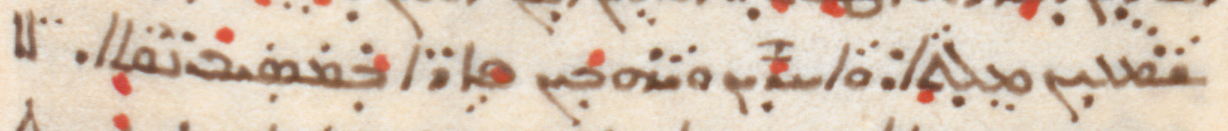ܫ̇ܡܥܝܢ ܡܠ̣ܬܐ܇ ܘܐܚܕܝܢ ܘܝ̇ܗܒܝܢ ܦܐܪ̈ܐ ܒܡܣܝܒܪܢܘܬܐ. ܠܐ
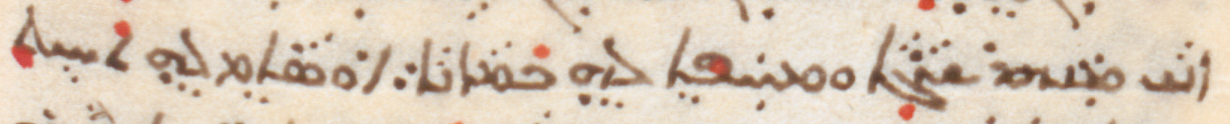ܐܢܫ ܡܢܗܪ ܫܪܓܐ ܘܡܚܦܐ ܠܗ ܒܡܐܢܐ܇ ܐܘ ܣ̇ܐܡ ܠܗ ܬܚܝܬ
